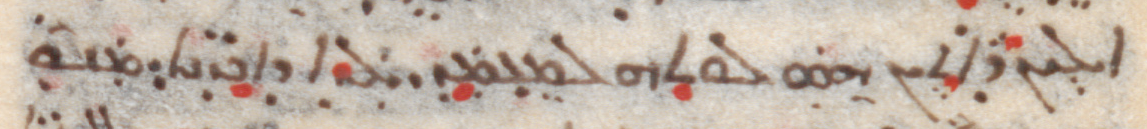ܐܝܠܝܢ ܕܐܬܝܢ ܗܘܘ ܠܘܬܗ ܠܡܥܡܕ. ܝܠܕܐ ܕܐܟܕ̈ܢܐ܆ ܡܢܘ
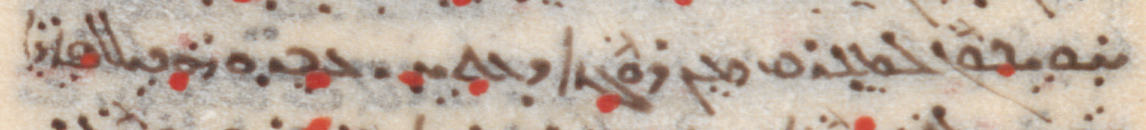ܚܘܝܟܘܢ ܠܡܥܪܩ ܡ̣ܢ ܪܘܓܙܐ ܕܥܬܝܕ. ܥܒܕܘ ܗܟܝܠܐ ܦܐܪ̈ܐ
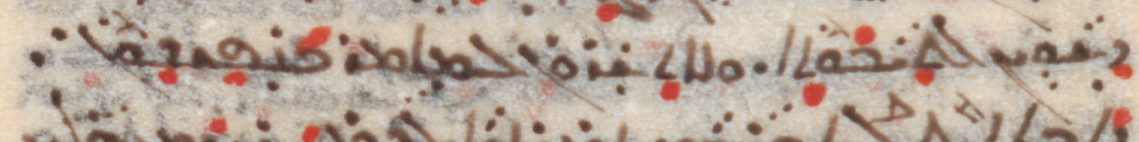ܕܫܘܝܢ ܠܬܝܒܘܬܐ. ܘܠܐ ܬܫܪܘܢ ܠܡܐܡܪ ܒܢܦܫܟܘܢ܇
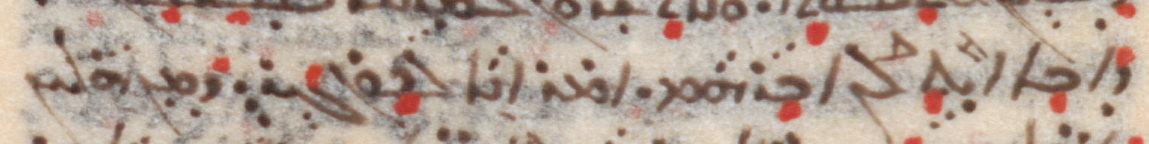ܕܐܒܐ ܐܝܬ ܠܢ ܐܒܪܗܡ. ܐܡ̇ܪ ܐܢܐ ܠܟܘܢ ܓܝܪ܆ ܕܡ̣ܢ ܗܠܝܢ
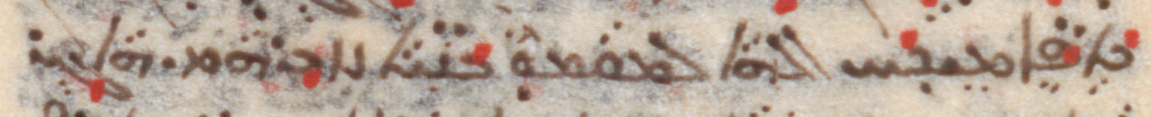ܟܐܦ̈ܐ ܡܫܟܚ ܐܠܗܐ ܠܡܩܡܘ ܒܢ̈ܝܐ ܠܐܒܪܗܡ. ܗܐ ܓܝܪ
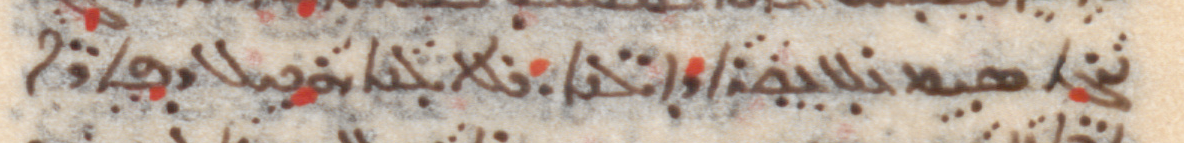ܢܪܓܐ ܣܝܡ ܥܠ ܥܩܪܐ ܕܐܝ̈ܠܢܐ: ܟܠ ܐܝܠܢܐ ܗܟܝܠ ܕܦܐܪ̈ܐ
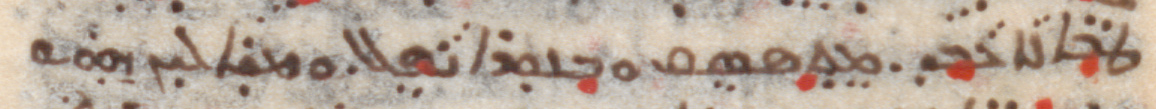ܛܒ̈ܐ ܠܐ ܥܒܕ. ܡܬܦܣܩ ܘܒܢܘܪܐ ܢ̇ܦܠ. ܘܡܫܐܠܝܢ ܗܘܘ
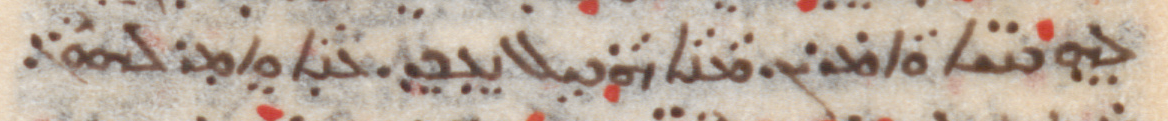ܠܗ ܟܢ̈ܫܐ ܘܐܡ̇ܪܝܢ. ܡܢܐ ܗܟܝܠ ܢܥܒܕ. ܥܢ̣ܐ ܘܐܡ̣ܪ ܠܗܘܢ.
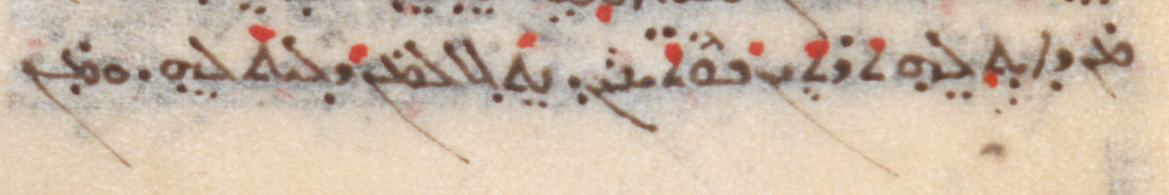ܡ̇ܢ ܕܐܝܬ ܠܗ ܬܪܬܝܢ ܟܘܬ̈ܝܢܝܢ܆ ܢܬܠ ܠܡ̇ܢ ܕܠܝܬ ܠܗ. ܘܡ̇ܢ
